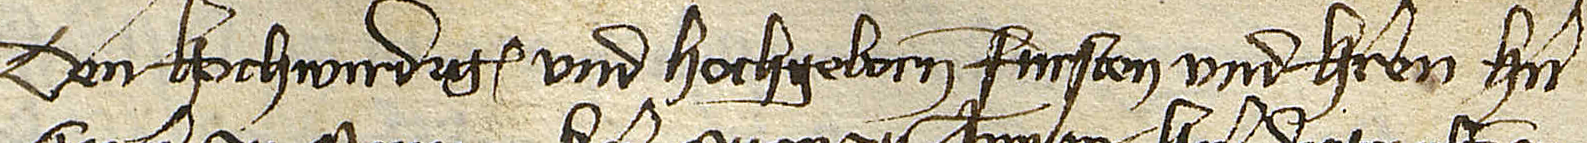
Den hochwirdig* vnd hochgeborn* furſten vnd hren* hn*
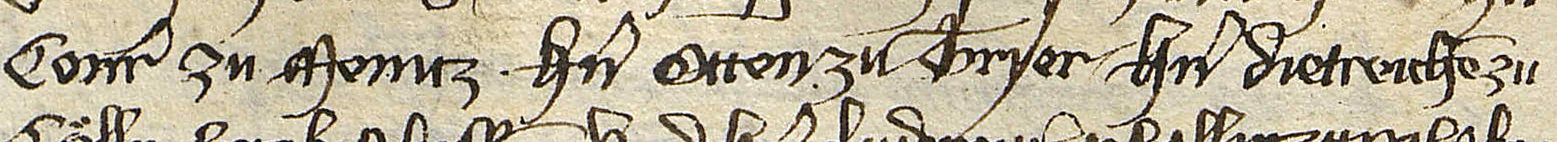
Conr* cʒu Meincʒ . hn* Otten cʒu Tryer / hn* dietreiche* ʒu
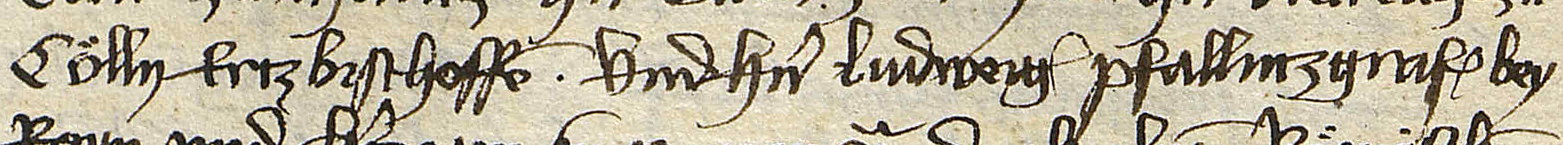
Cölln Ercʒbiſchoffe* . Vnd hn* ludweig* pfallncʒgraf* bey
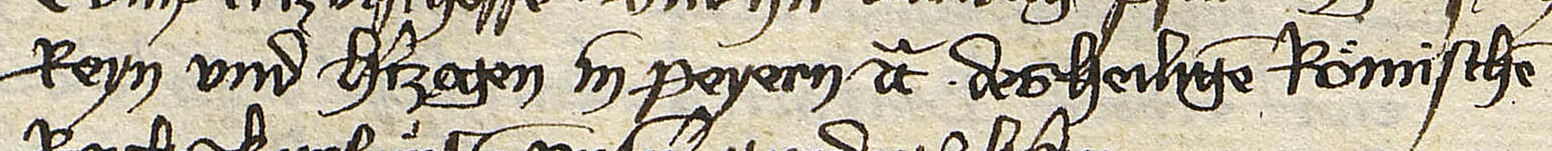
Reyn vnd h*cʒogen in Peyern ec* . des heilige* Römiſche*
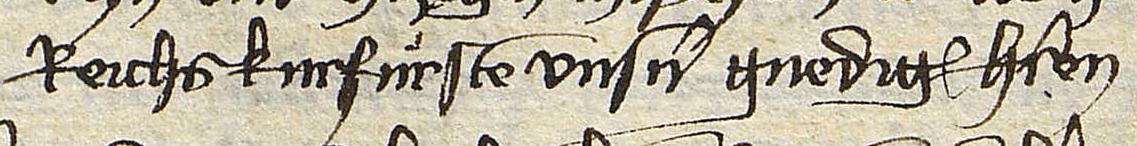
Reichs kurfürſte* vnſ*n gnedig* h*ren
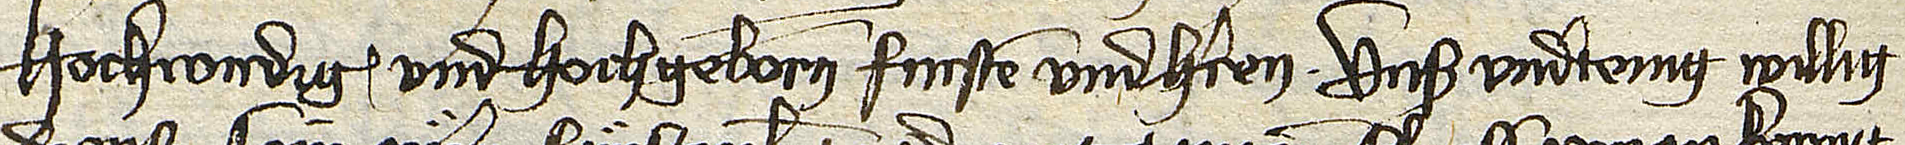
Hochwirdig* vnd hochgeborn* furste* vnd h*ren . Vnſ* vnd*tenig willig
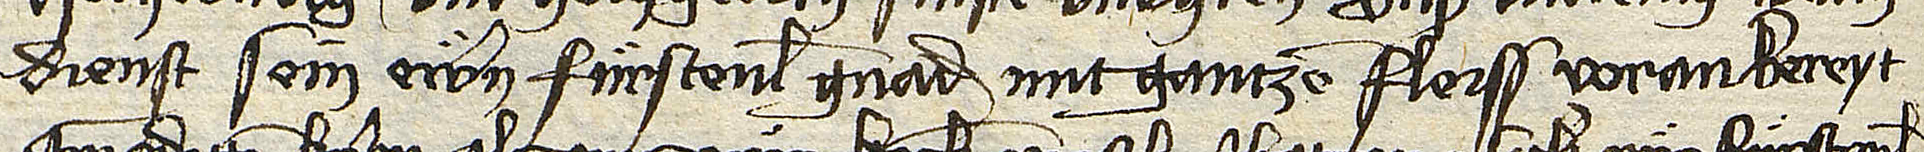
dienſt ſein ew*n fürſtenl* gnad* mit gancʒe* fleiſſ voran bereyt
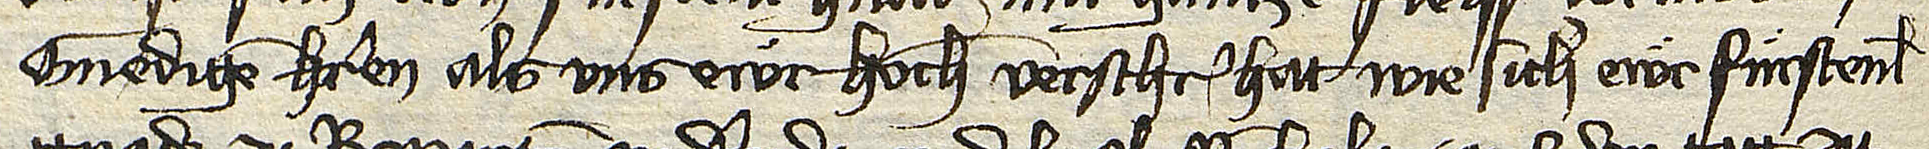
Gnedige* h*ren als vns ewr hoch* verſchr* hat wie ſich ewr fürstenl*
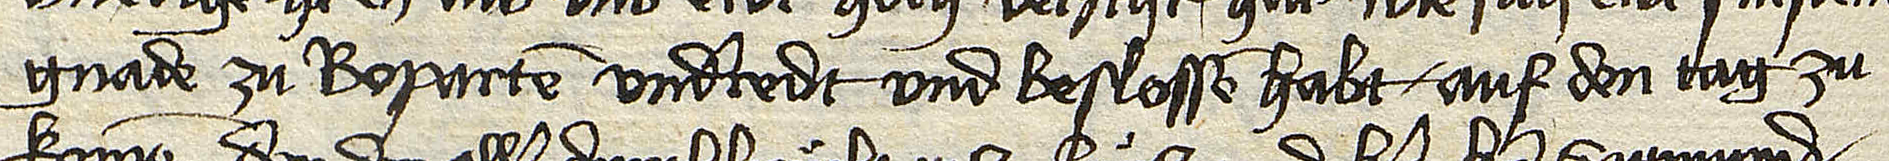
gnade ʒu Beparte* vnd*redt vnd beſloſſe* habt / auf den tag ʒu
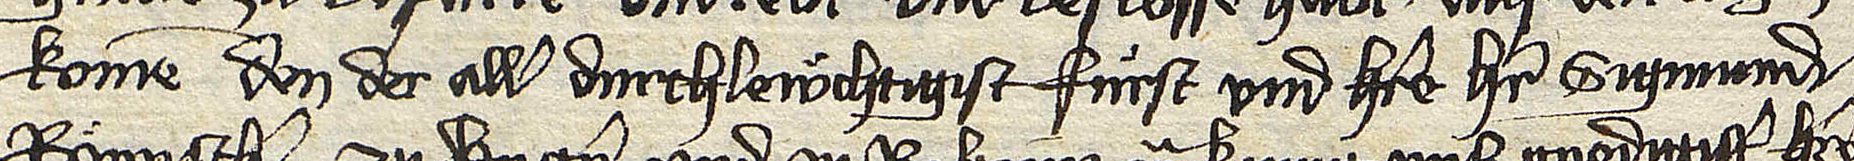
kome* den der all* durchlewchtigiſt fürſt vnd h*re . hr* Sigmund
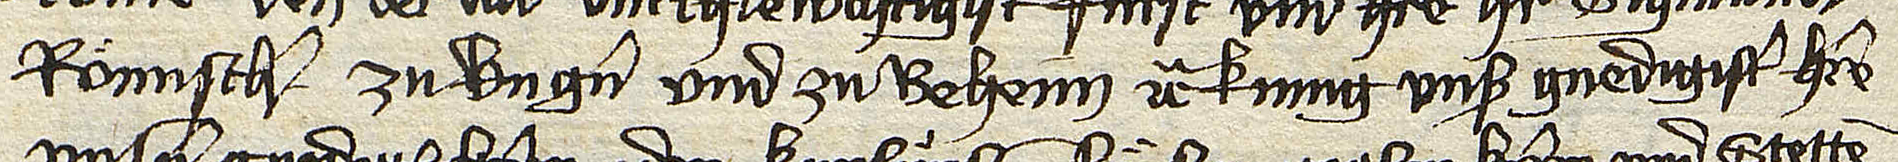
Römiſch* ʒu Vng*n vnd cʒu Beheim ec* kunig vnſ* gnedigiſt* hr*e
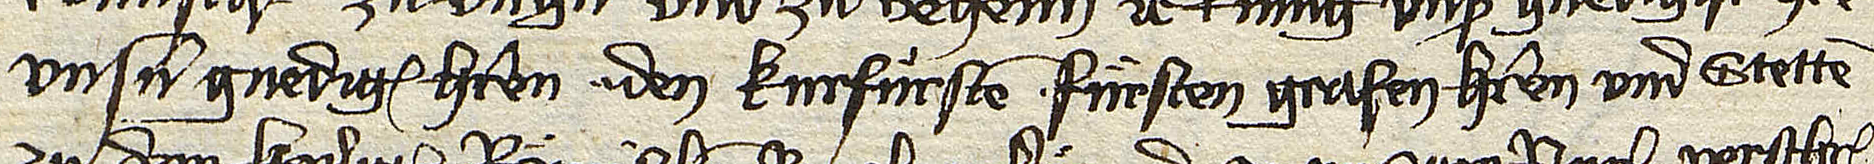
vnſ*n gnedig* h*ren ~ den kurfürſte* . fürſten grafen h*ren vnd Stette*
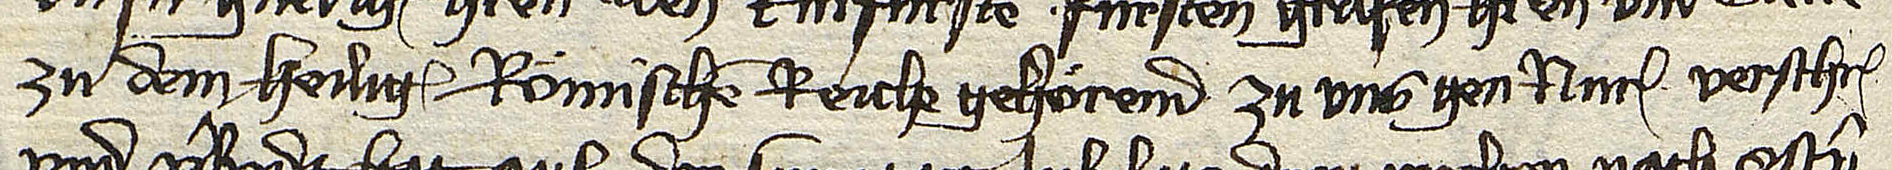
ʒu dem heilig* Römiſche* Reiche gehörend cʒu vns gen Nur* verſchr*
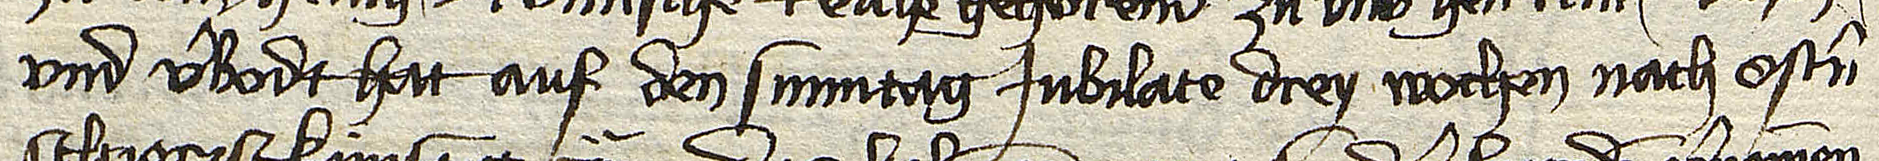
vnd v*bodt hat auf den ſunntag Iubilate drey wochen nach Ost*n
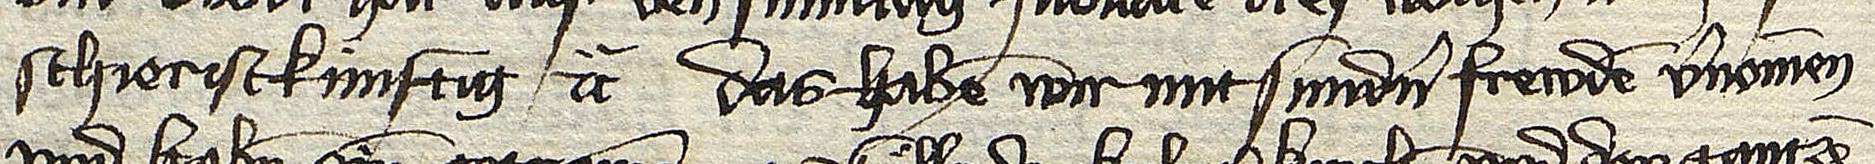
ſchieriſtkünftig ec* Das habe* wir mit ſundn* frewde* v*nom*en
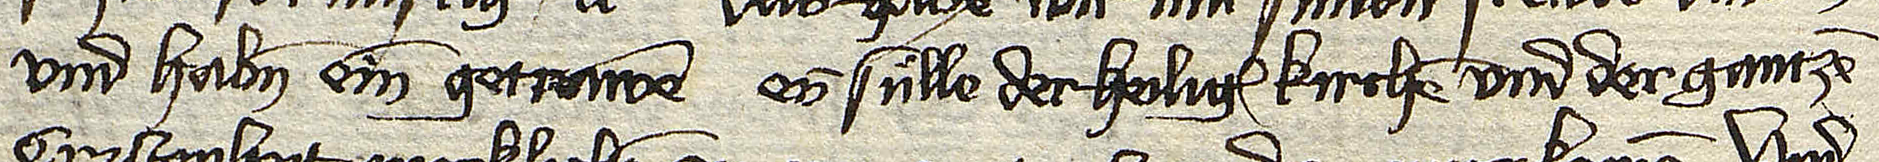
vnd habn* ein* getrawe* es ſülle der heilig* kirche vnd der gancʒe*
